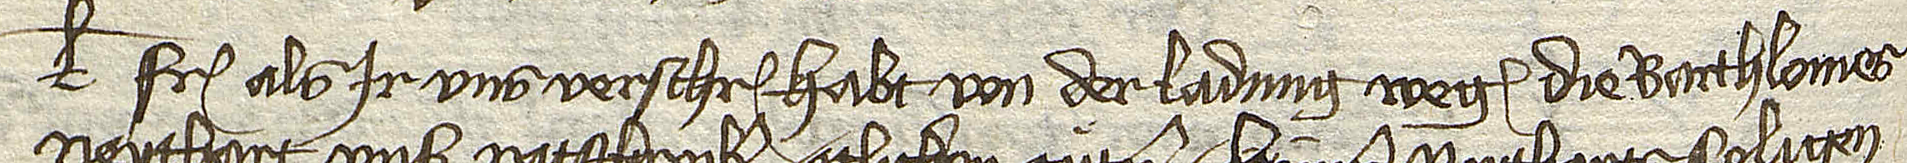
L* fr* als Ir vns verſchr* habt von der ladung weg* die Barthlomes
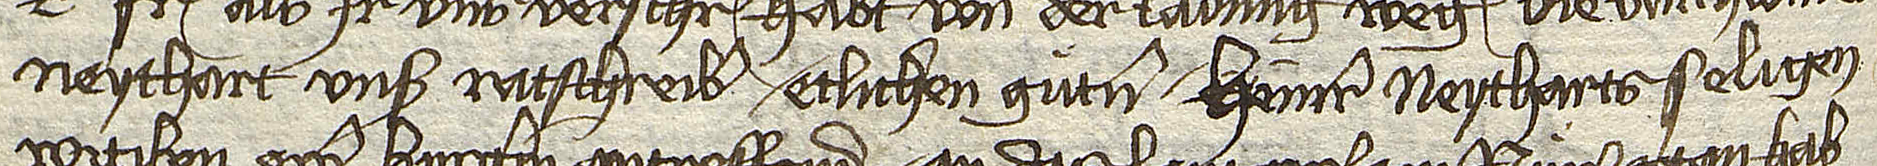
Neythart vnſ* ratſchreib* / etlichen güt*n / Heinr* Neytharts ſeligen
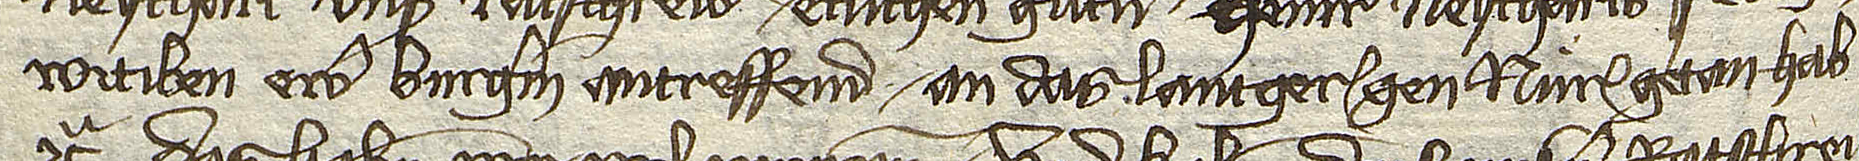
witiben ew* burg*in antreffend / an das lantger* gen Nür* getan hab
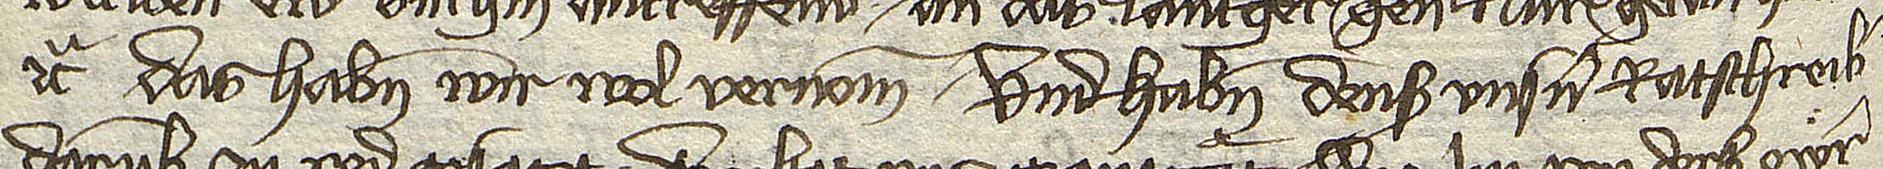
ec* / Das habn* wir wol vernom* / Vnd habn* denſ* vnſn* Ratſchreib*
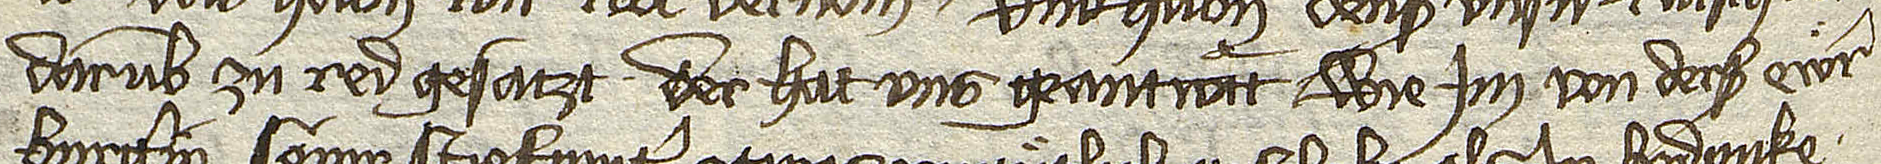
darub* ʒu red geſacʒt . Der hat vns geantw*tt / wie Im von derſ* eẅr*
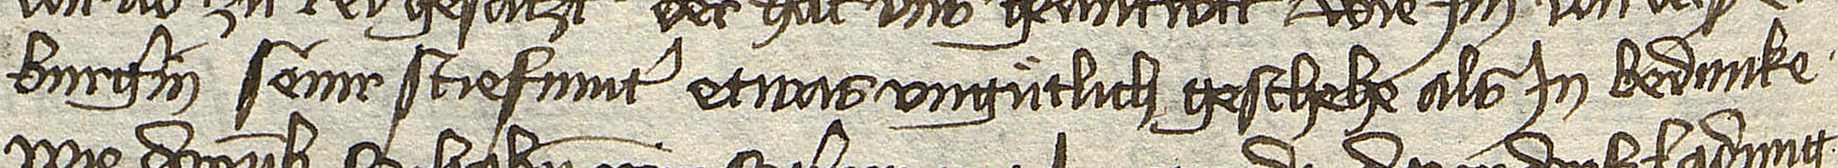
burg*in ſeinr ſtiefmut* etwas vngütlich geſchehe als In bedunke
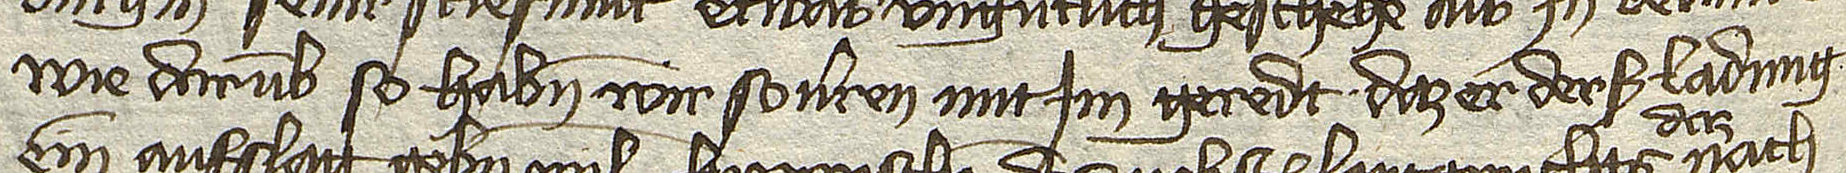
wie darub* ſo habn* wir ſou*ren mit Im geredt . daʒ er derſ* ladung
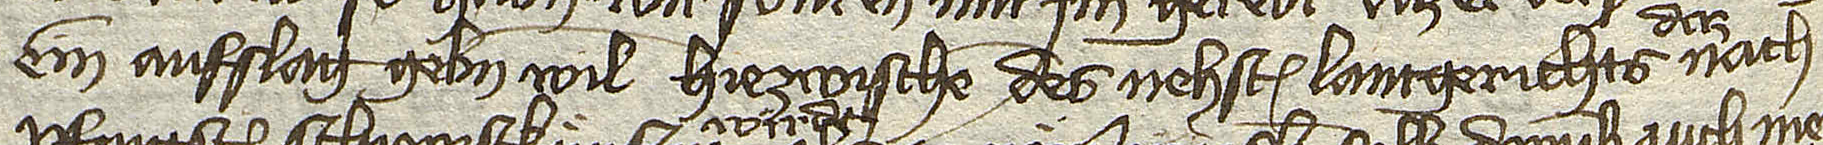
ein* aufſlag gebn* wil hieʒwiſche* des nehſt lantgerichts nach
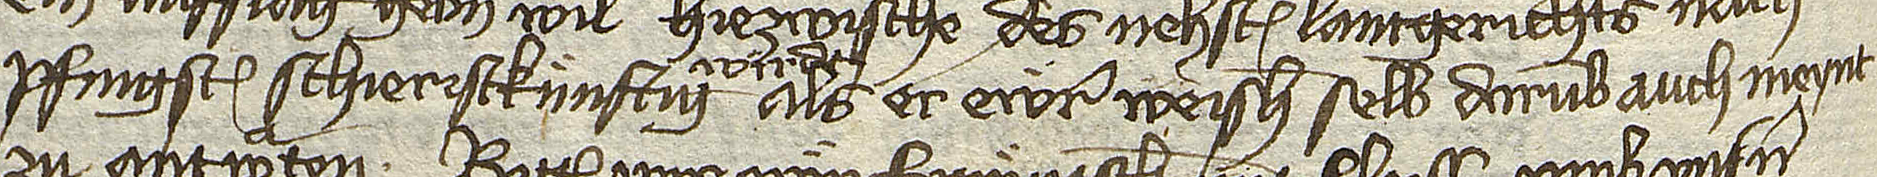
Pfingſt* ſchieriſtkünftig als er eẅr* weiſh* ſelb darub* auch meynt
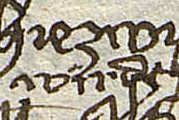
wirdt
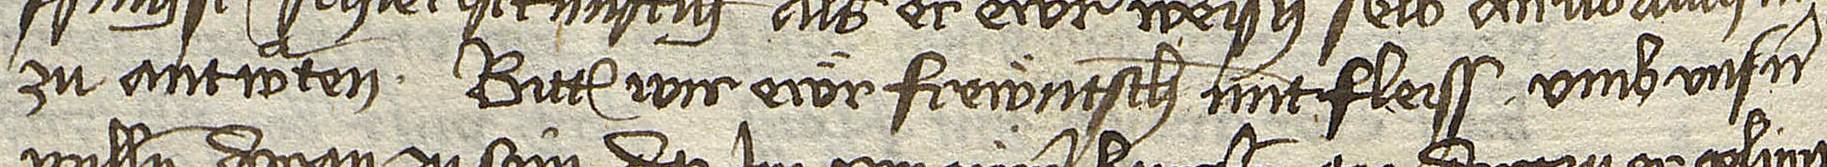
ʒu antw*ten . Bitt* wir eẅr freẅntſch* mit fleiſſ . vmb vnſn*
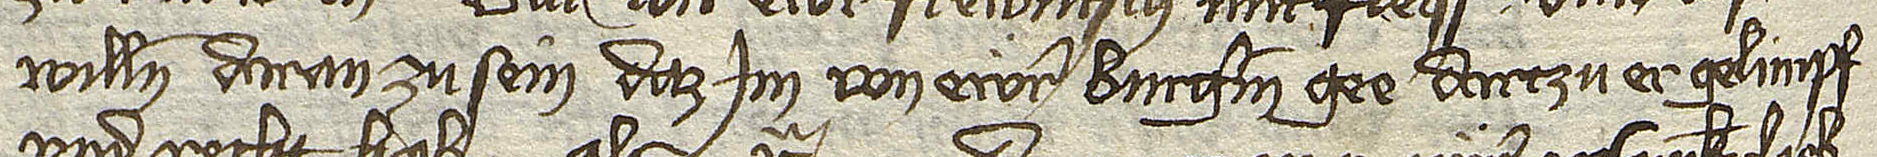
willn* daran ʒu ſein daʒ Im von eẅr* burg*in gee darcʒu er gelimpf
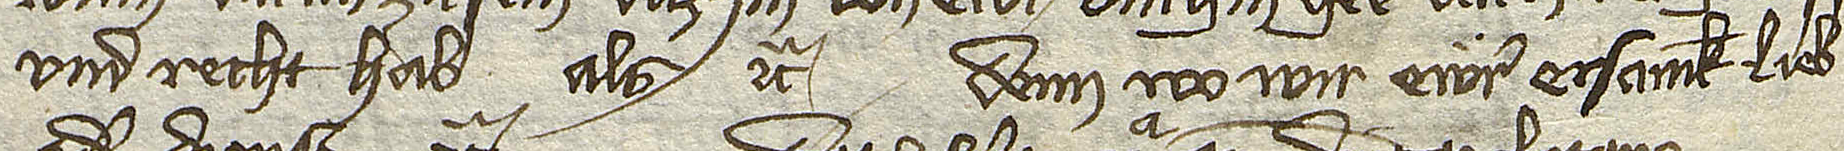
vnd recht hab als ec* / Denn wo wir eẅr* erſamk* lieb
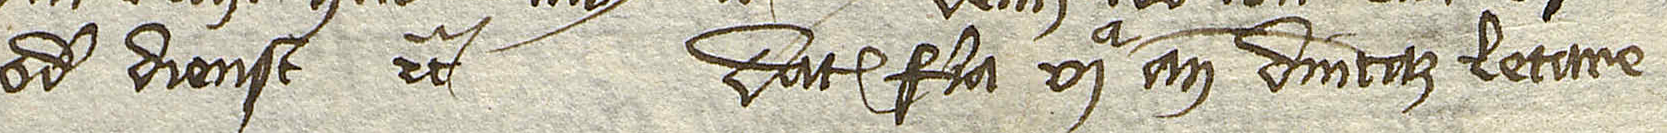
od* dienſt ec* Dat* f*ia vi* an* dnica* letare
